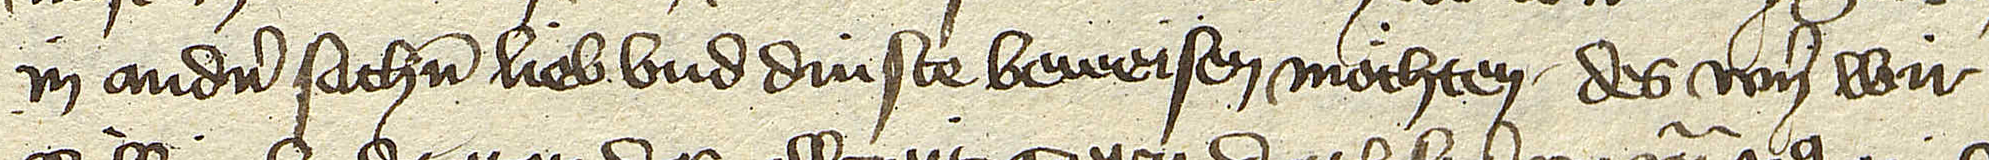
in andn* ſachn* lieb vnd dinſte beweiſen möchten / des wn* wir
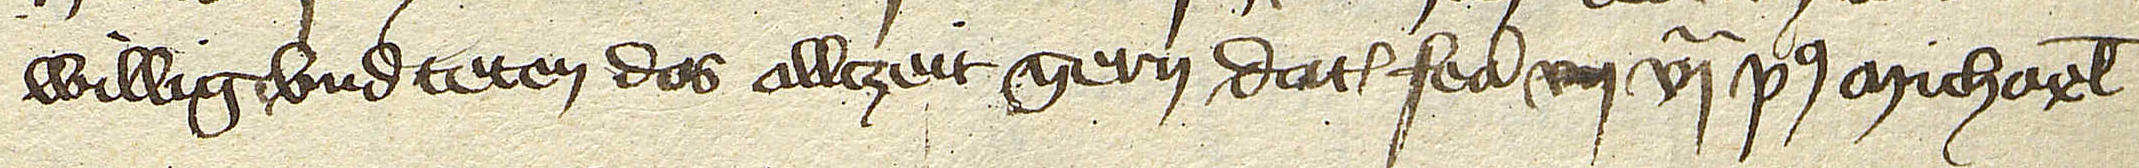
willig / vnd teten das allcʒeit gern / dat* fea* vii vi* p* Michael*
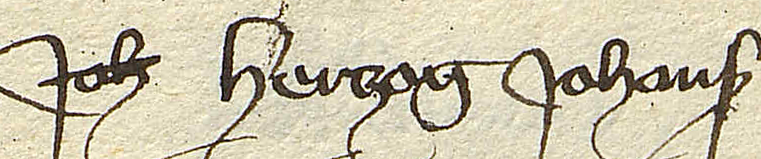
Ioh Hercʒog Iohanſ*
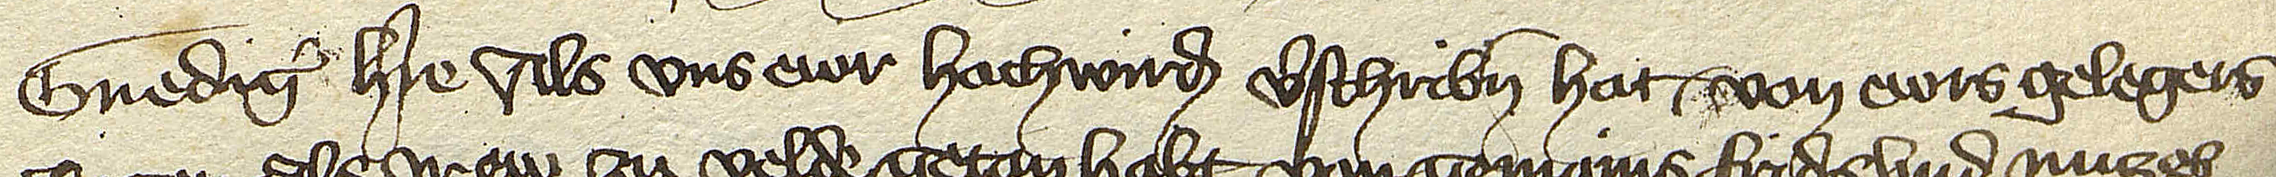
Gnedig* h*re Als vns ewr hochwird* v*ſchribn* hat / von ewrs gelegers
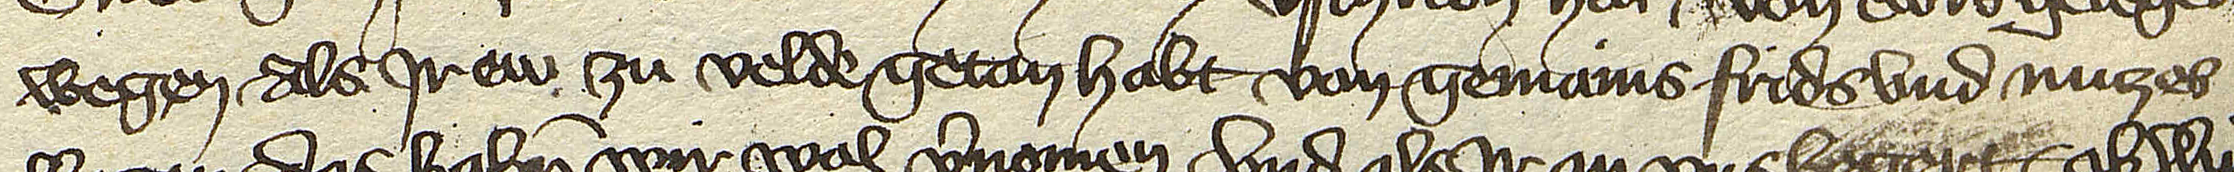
wegen / Als Ir ew cʒu velde getan habt von gemains frids vnd nucʒes
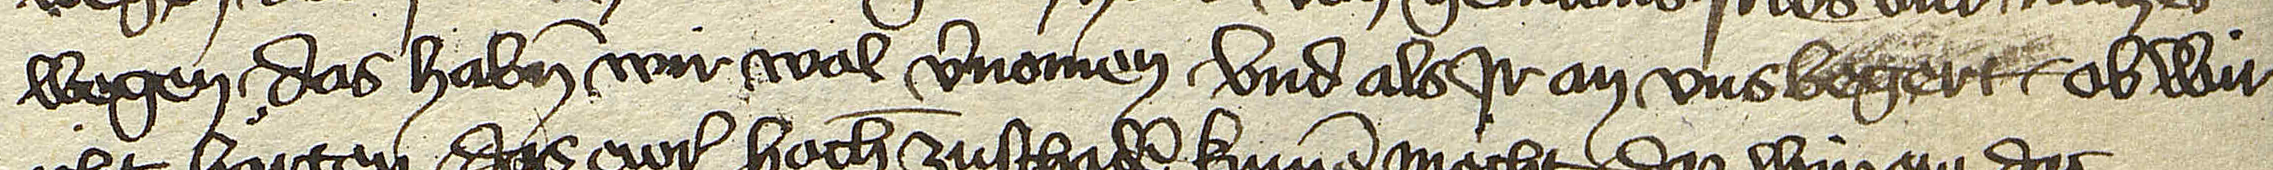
wegen / das habn* wir wol v*nomen / vnd als Ir an vns begert / ob wir
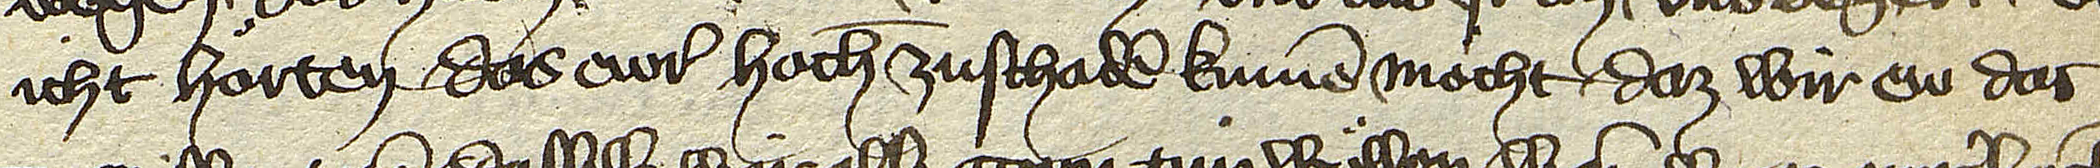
icht hörten / das ewr* hoch* cʒuſchad* kume* möcht / daʒ wir ew das
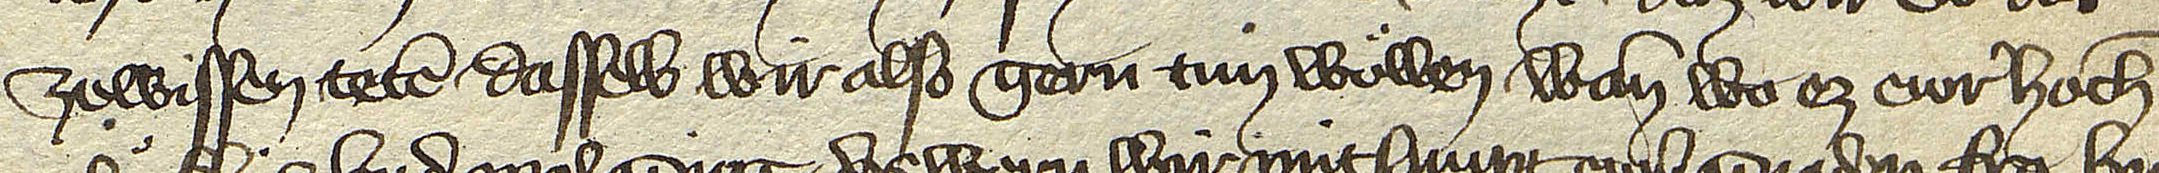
cʒewiſſen tete* daſſelb wir alſo gern tun wöllen / wan* wo eʒ ewr* hoch*
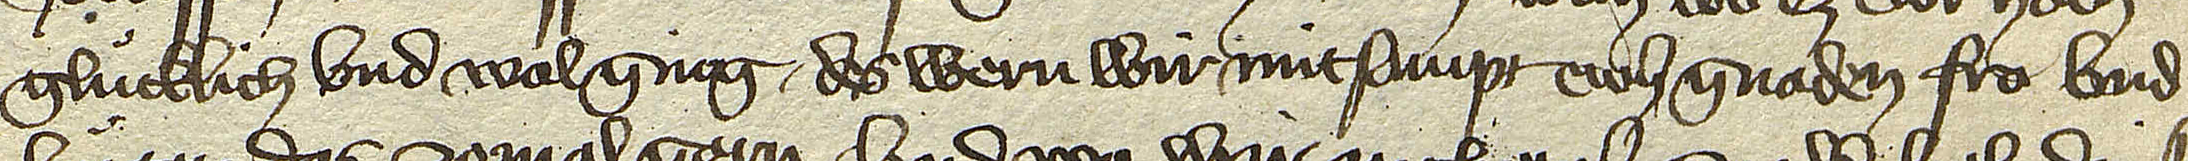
glücklich vnd wol ging / des wern wir mitſampt ew*n gnaden fro vnd
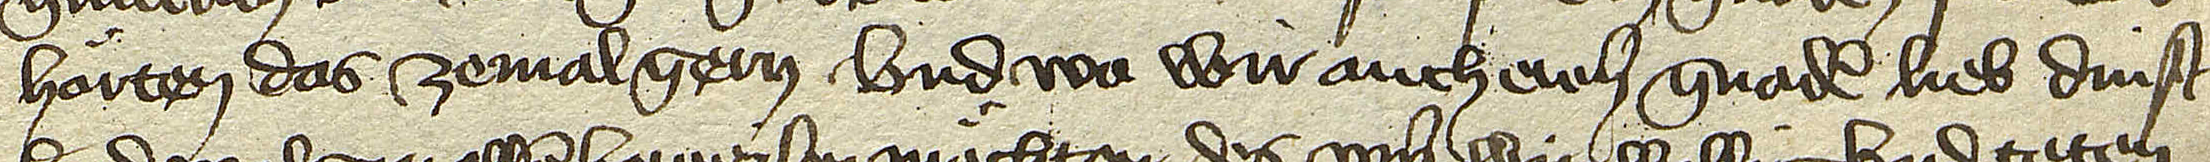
hörten das cʒemal gern / vnd wo wir auch ew*n gnade* lieb dinſt
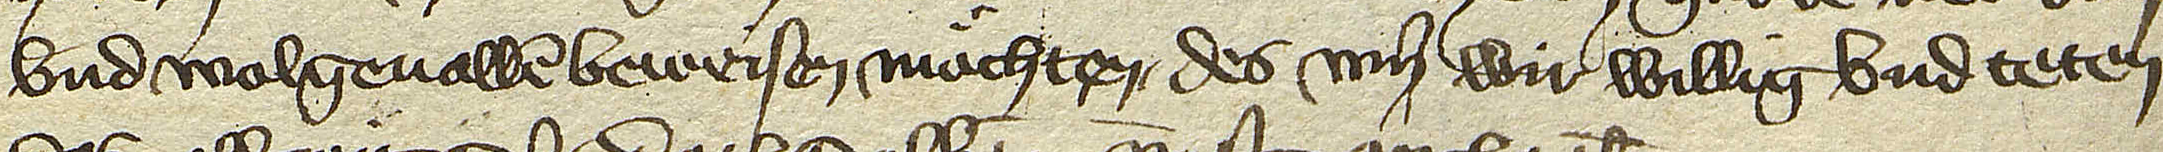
vnd wolgeualle* beweiſen möchten / des w*n wir willig vnd teten
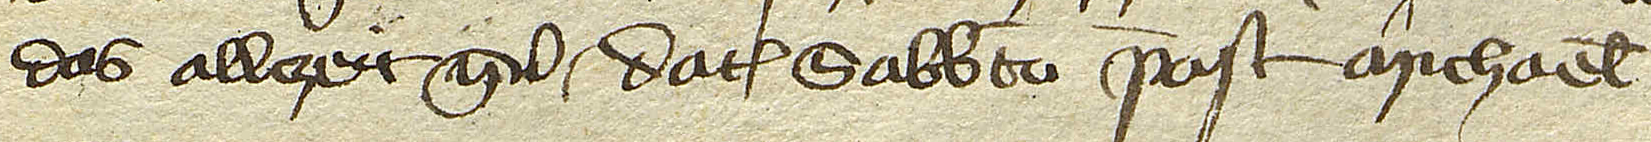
das allcʒeit gn* / Dat* Sabbto* poſt Michael*
